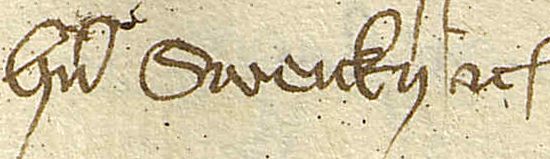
hn* Sweickn* ec*
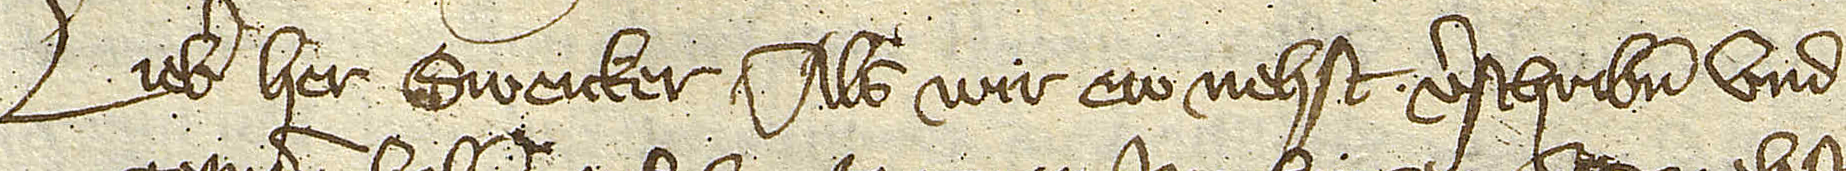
Lieb* her Sweicker / Als wir ew nehſt v*ſchribn* vnd
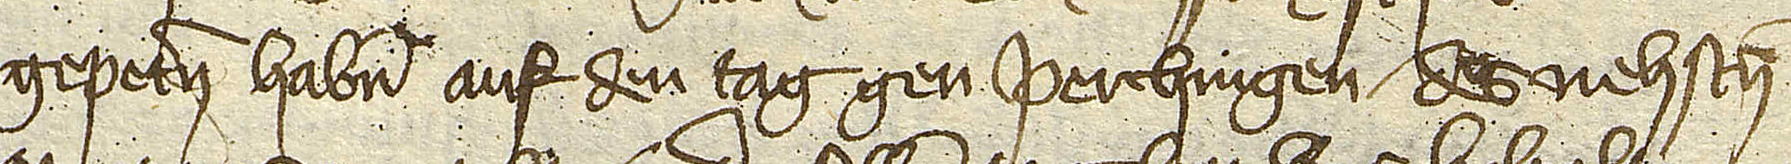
gepetn* habn* auf den tag gen Perchingen / des nehſtn*
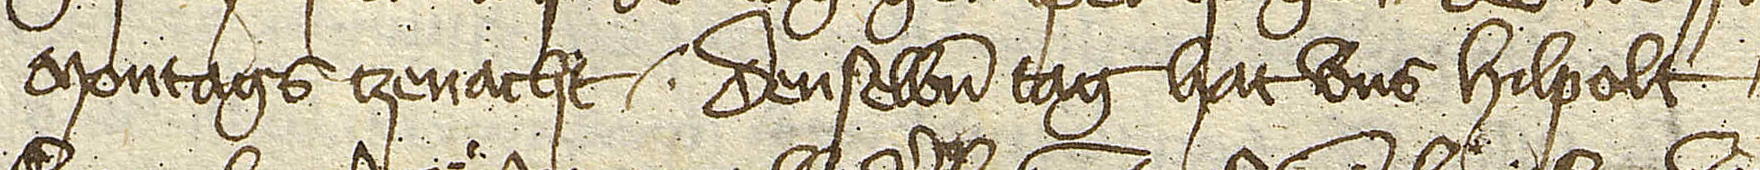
Montags cʒenacht / . Denſelbn* tag hat vns hilpolt
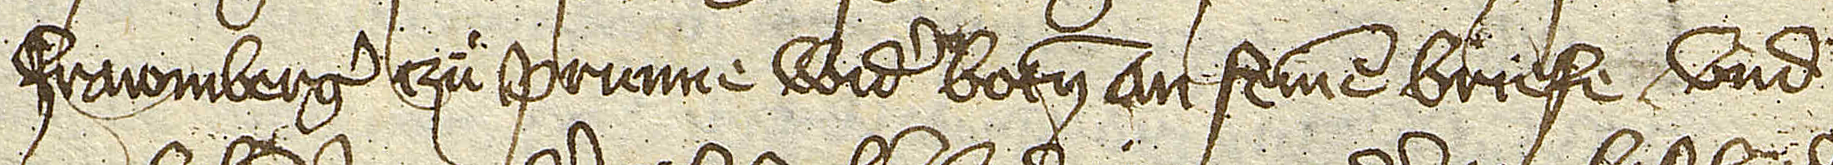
Frawmberg* cʒü Prunne wid* botn* an ſeine* briefe / vnd
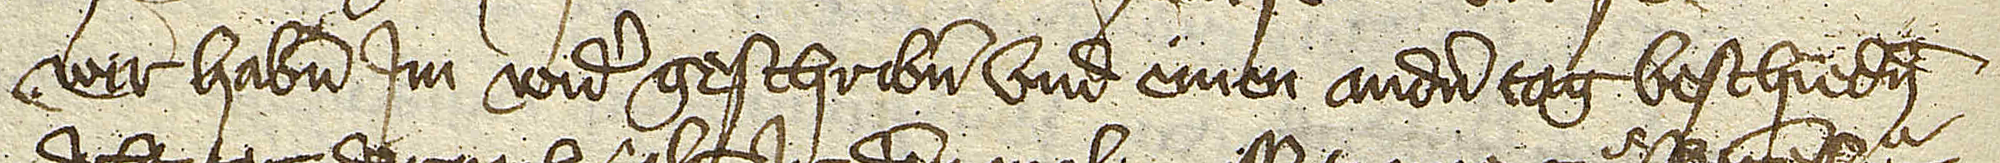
wir habn* Im wid* geſchribn* vnd einen andn* tag beſchiedn*
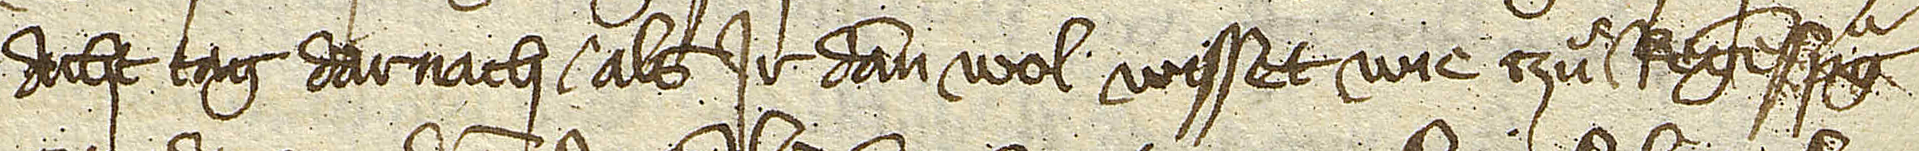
Acht tag darnach / als Ir dan* wol wiſſet wie cʒü Rege*ſp*g
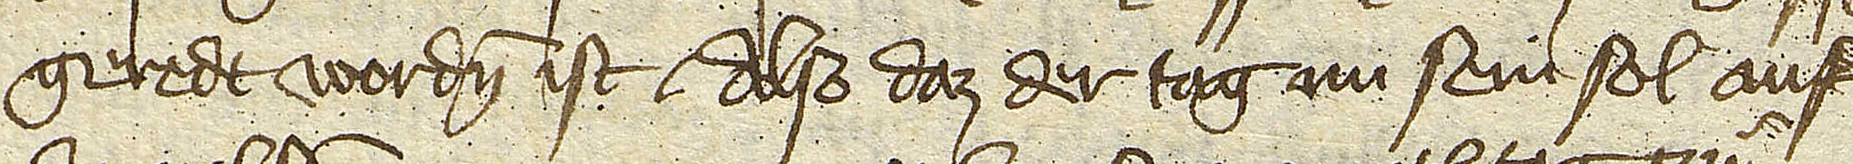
geredt wordn* iſt / Alſo daʒ der tag nu ſein ſol auf
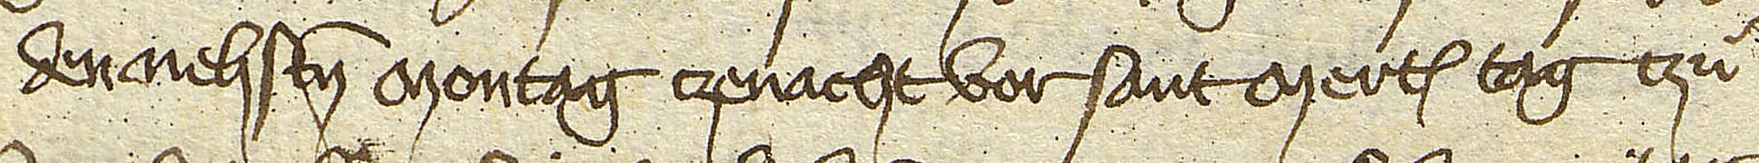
den nehſtn* Montag cʒenacht vor ſant Mert* tag cʒü
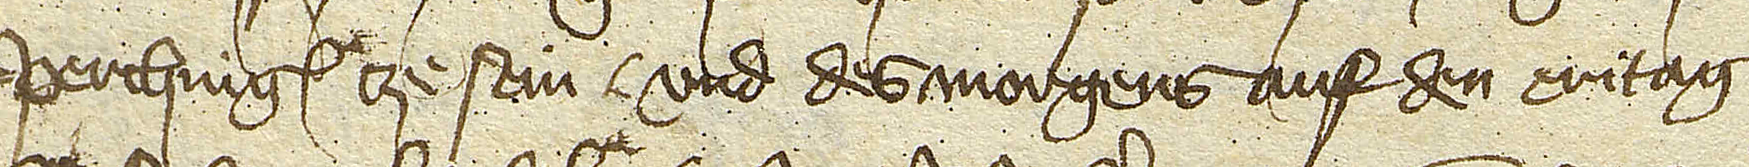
Perching* cʒe ſein / vnd des morgens auf den eritag
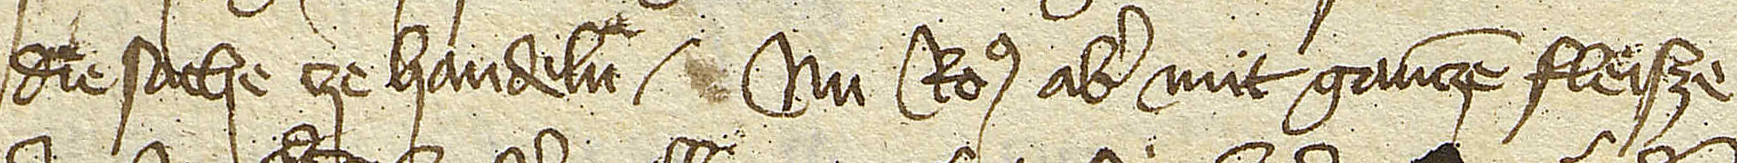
die ſache cʒe handeln / Nu Ro* ab* mit gancʒe* fleiſʒe
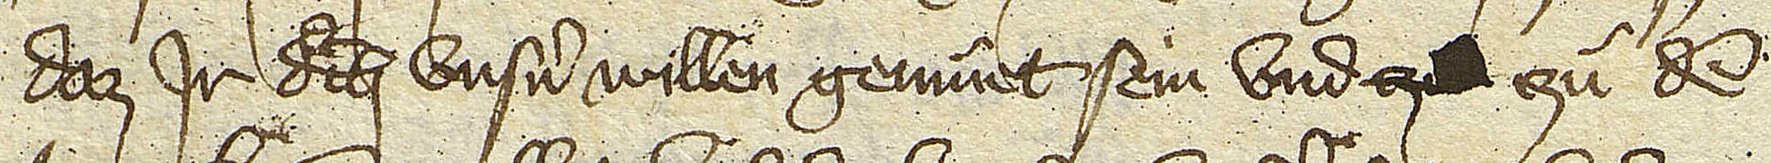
daʒ Ir d*ch vnſn* willen gemüet ſein vnd cʒu cʒü d*
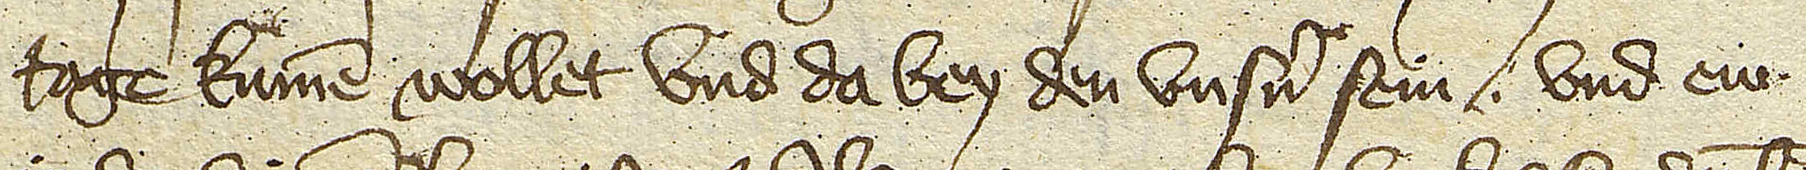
tage kume* wollet vnd da bey den vnſn* ſein / . vnd ew
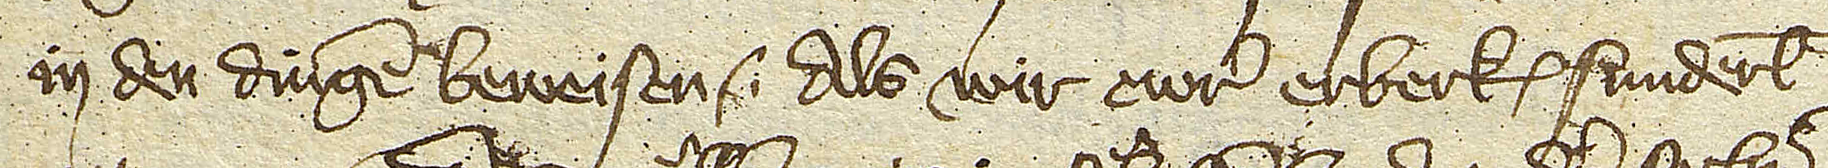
in den dinge* beweiſen / . Als wir ewr* erberk* ſunderl*
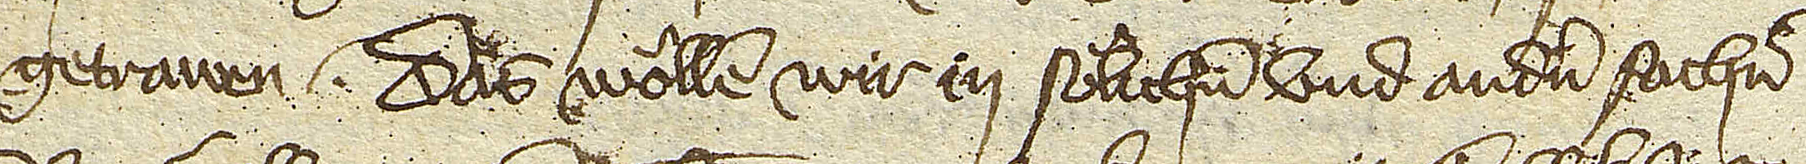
getrawen / . Das wölle* wir in ſölichn* vnd andn* ſachn*
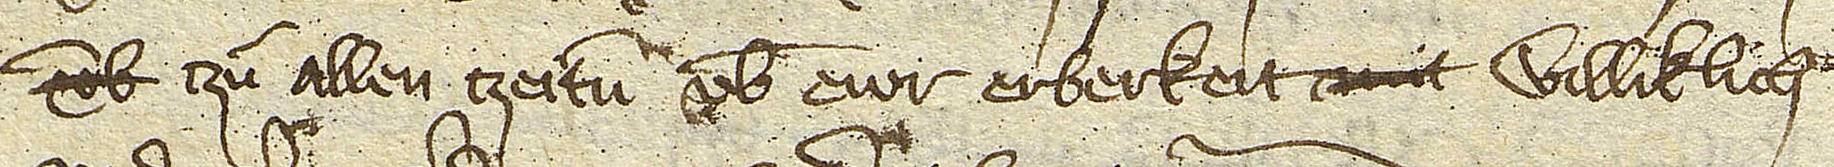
vb* cʒü allen cʒeitn* vb* ewr erberkeit mit williklich
